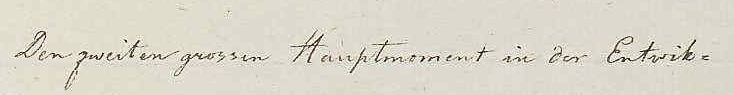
Den zweiten grossen Hauptmoment in der Entwik-
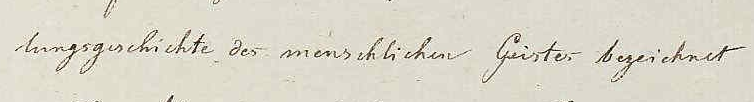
lungsgeschichte des menschlichen Geistes bezeichnet
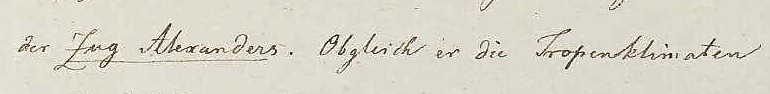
der Zug Alexanders. Obgleich er die Tropenklimaten
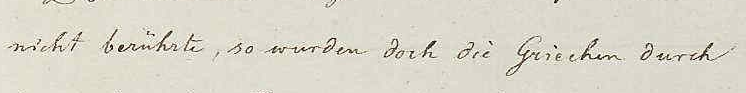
nicht berührte, so wurden doch die Griechen durch
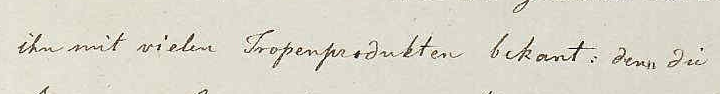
ihn mit vielen Tropenprodukten bekant: denn die
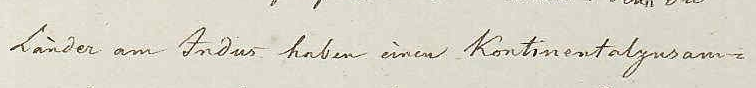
Länder am Indus haben einen Kontinentalzusam-
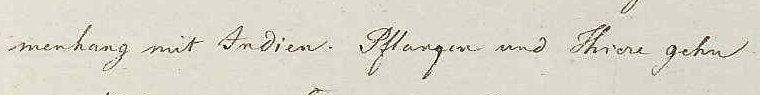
menhang mit Indien. Pflanzen und Thiere gehn
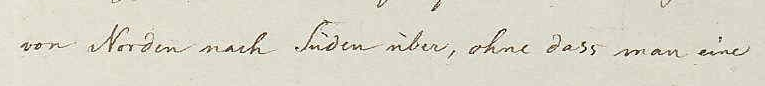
von Norden nach Süden über, ohne dass man eine
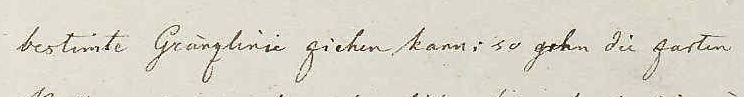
bestimte Gränzlinie ziehen kann: so gehn die zarten
